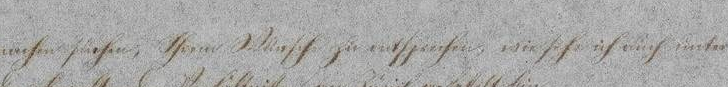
machen suchen, Ihrem Wunsche zu entsprechen, wie sehr ich auch unter
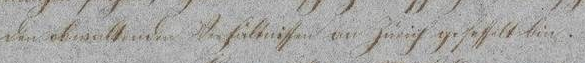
den obwaltenden Verhältnissen an Zürich gefesselt bin.
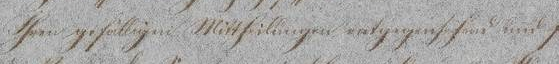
Ihren gefälligen Mittheilungen entgegensehend und
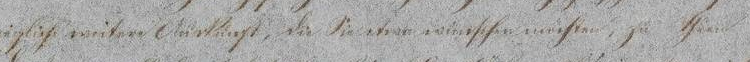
jegliche weitere Auskunft, die Sie etwa wünschen möchten, zu Ihren
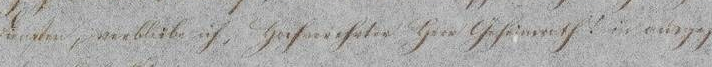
Diensten, verbleibe ich, Hochverehrter Herr Geheimrath! in ausgezeich-
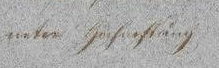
neter Hochachtung.
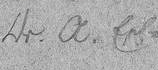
Ihr ergebener
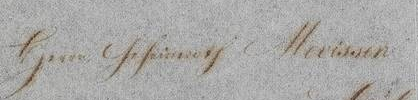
Herr Geheimrath Mevissen
